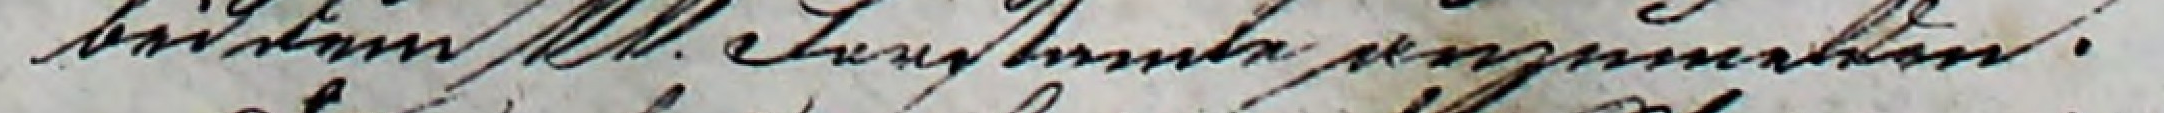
bei dem kk. Irrstande anzumelden.
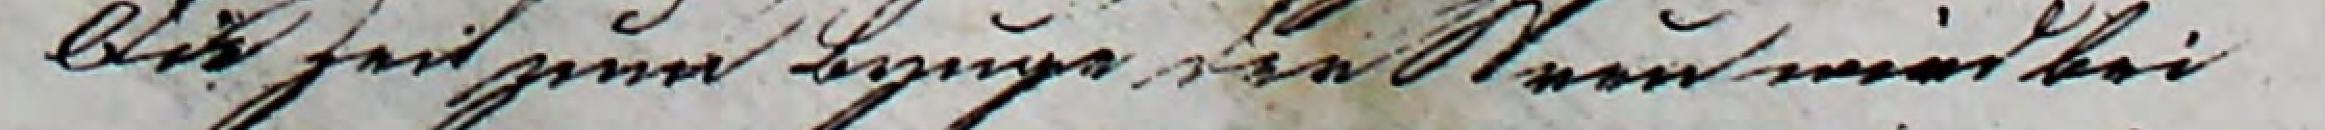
Die Zeit zum Bezuge der Streu wird bei
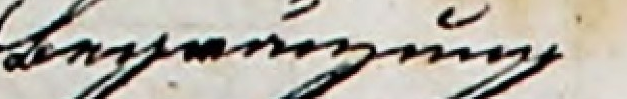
Begränzung
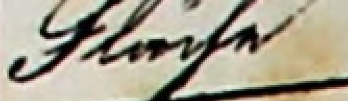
Fläche
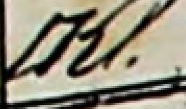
Kl.
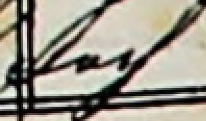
Joch
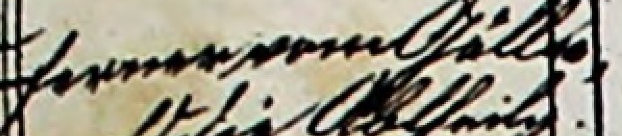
ferner vom Gülle„
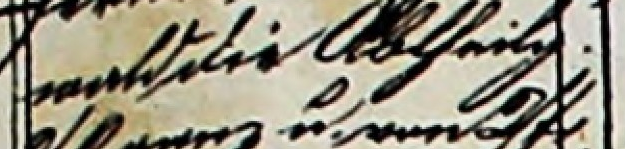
wald die Abtheilg.
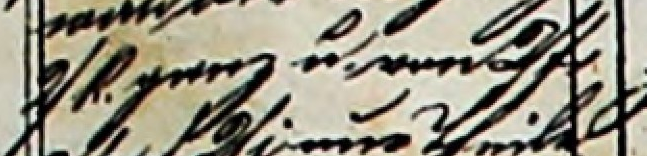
2/r. ganz u. von ???
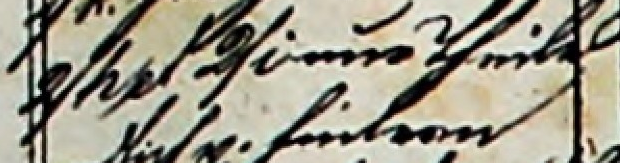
2/h, 2/i um Theile
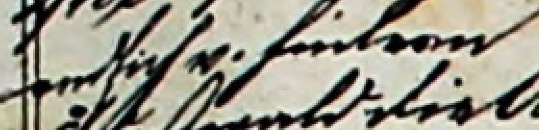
endlich v. hintern
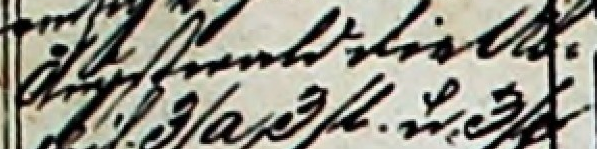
Augstwald die Ab„
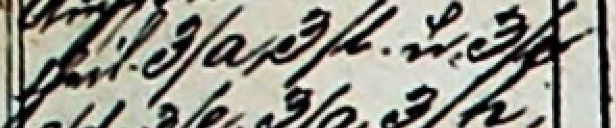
theil 3/a, 3/b. u. 3/f.
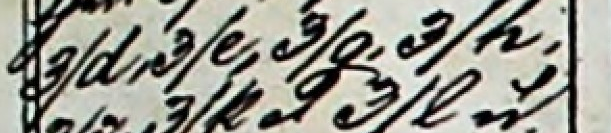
3/d, 3/e, 3/g, 3/h,
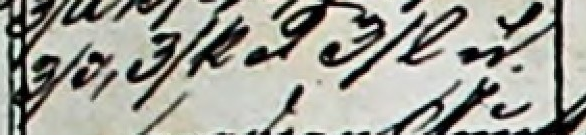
3/c, 3/k et 3/l u.
